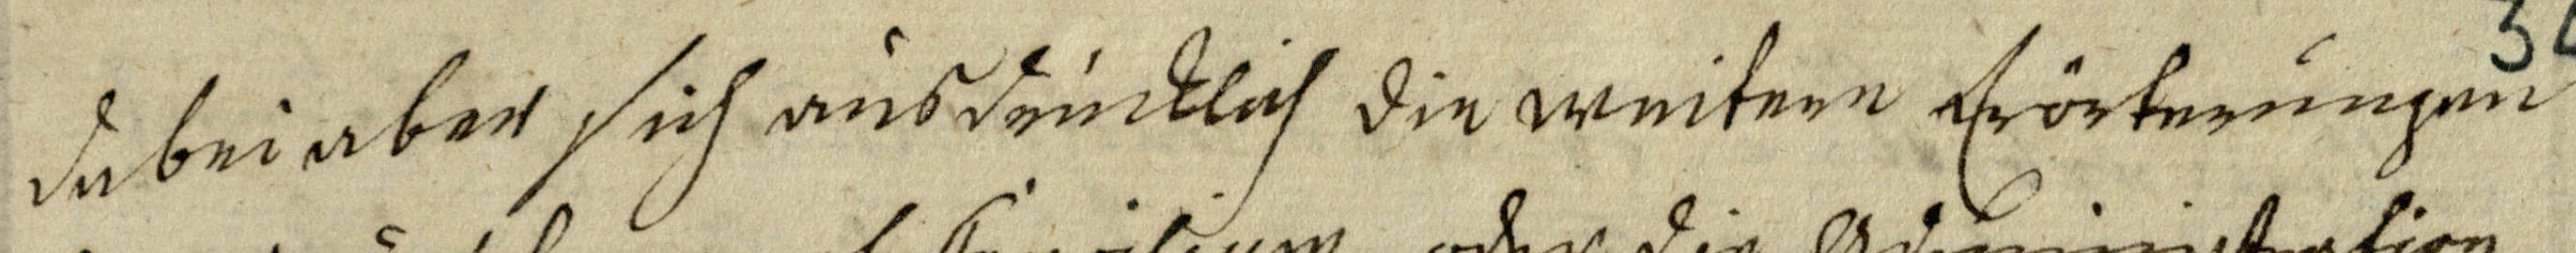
dabei aber sich ausdrücklich die weitern Erörterungen
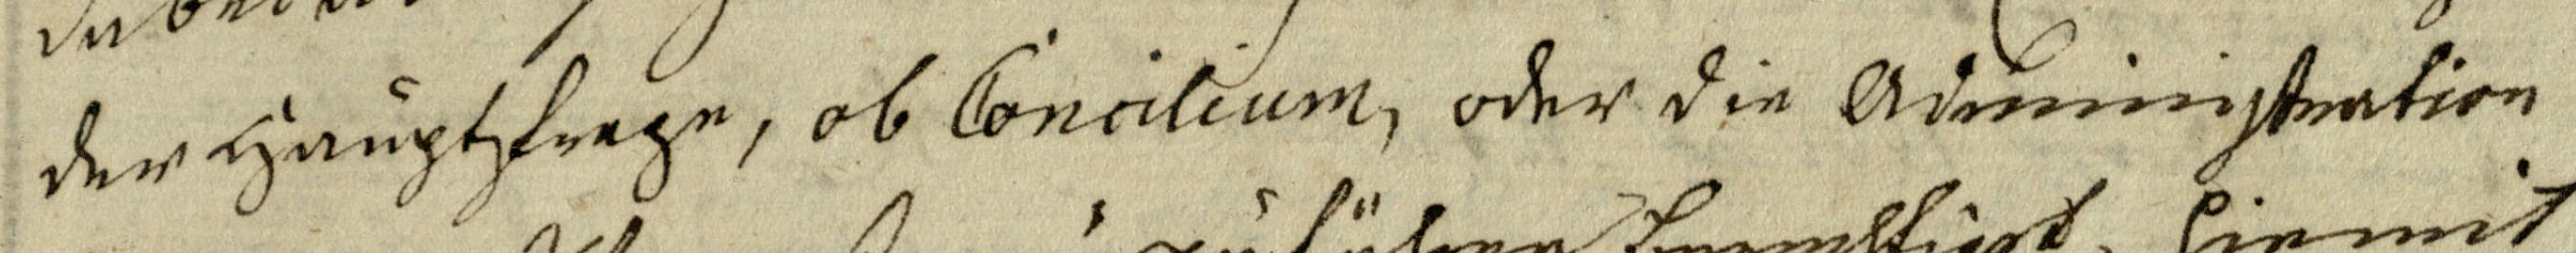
der Hauptfrage, ob Concilium, oder die Administration
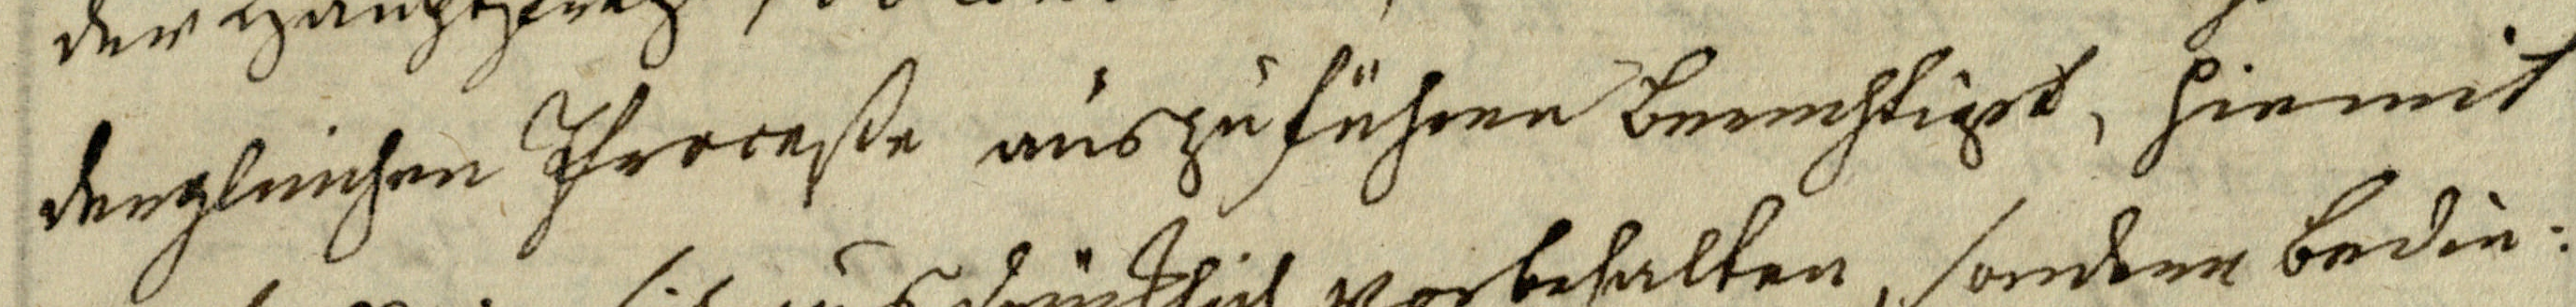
dergleichen Processe auszuführen berechtiget, hiemit
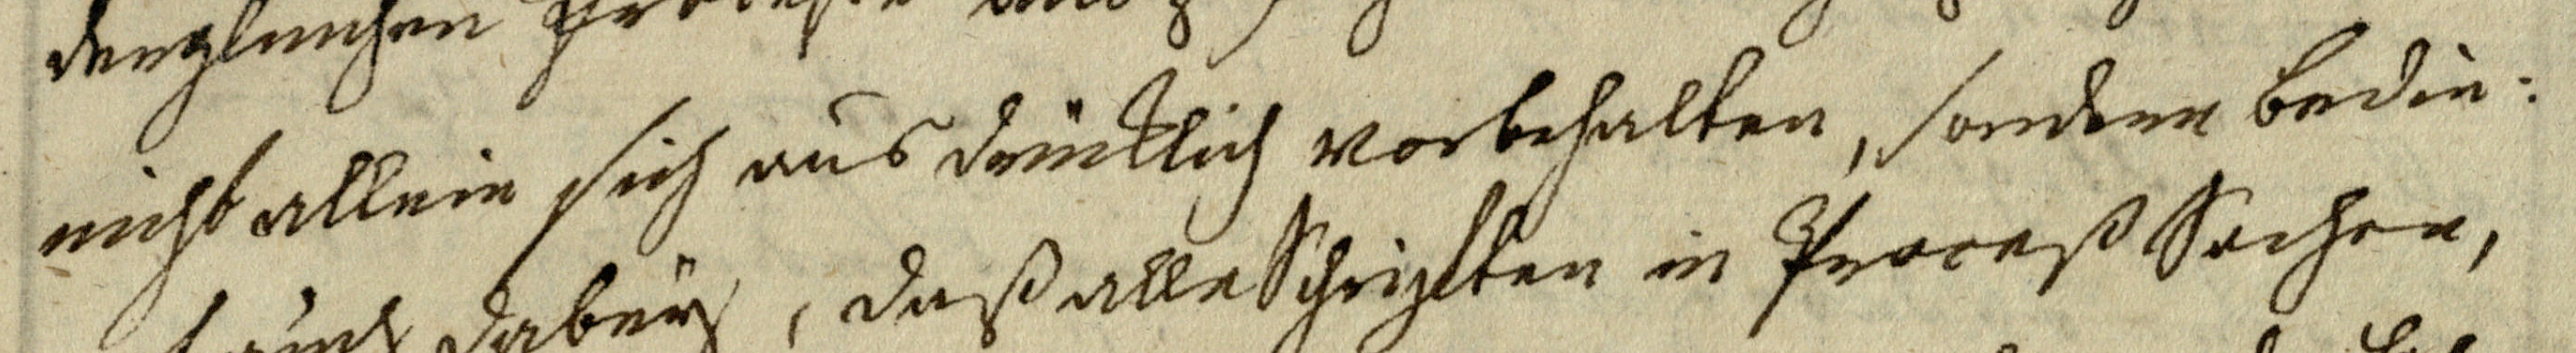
nicht allein sich ausdrücklich vorbehalten, sondern bedin¬
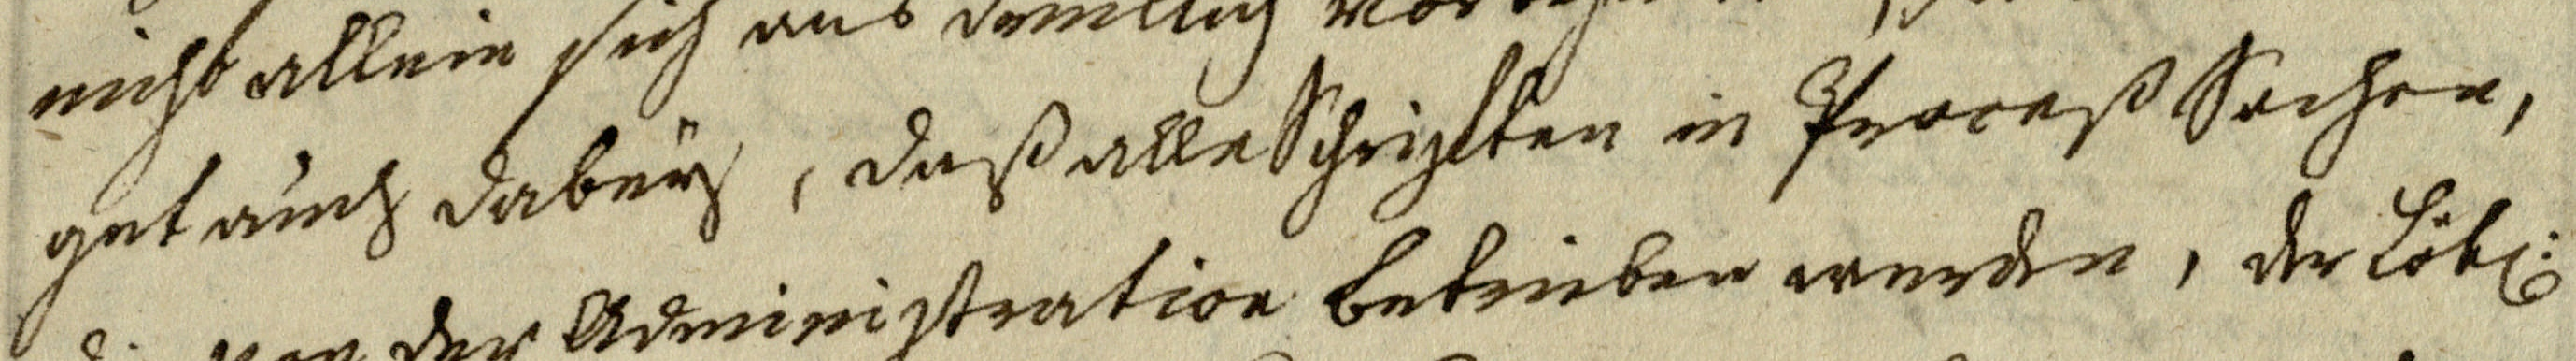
get auch dabeÿ, daß alle Schriften in Proceß Sachen,
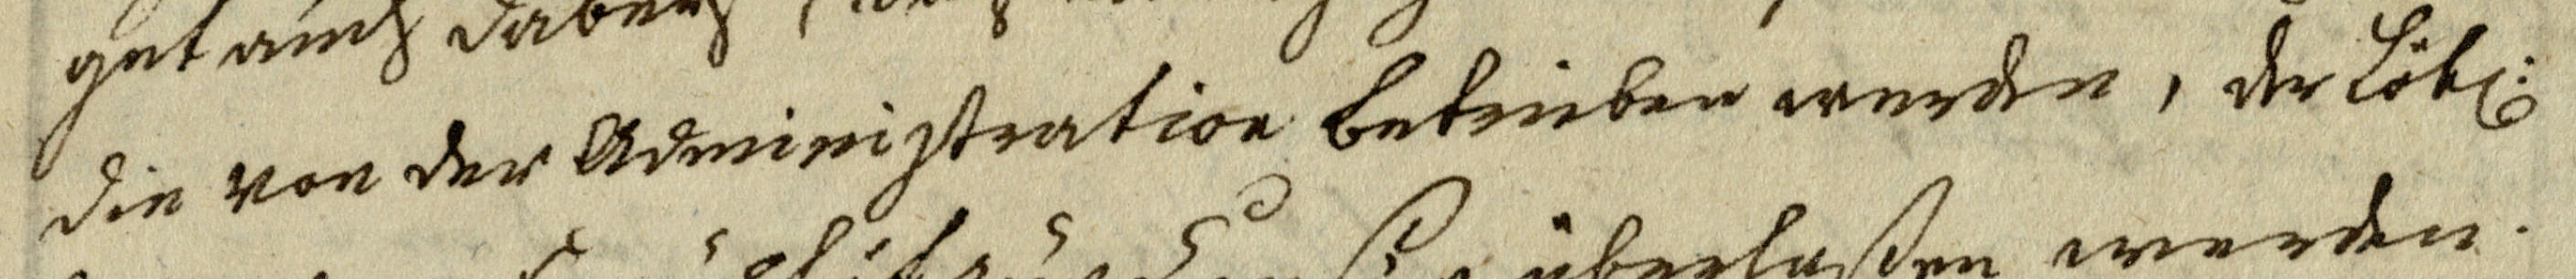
die von der Administration betrieben werden, der Löbl.
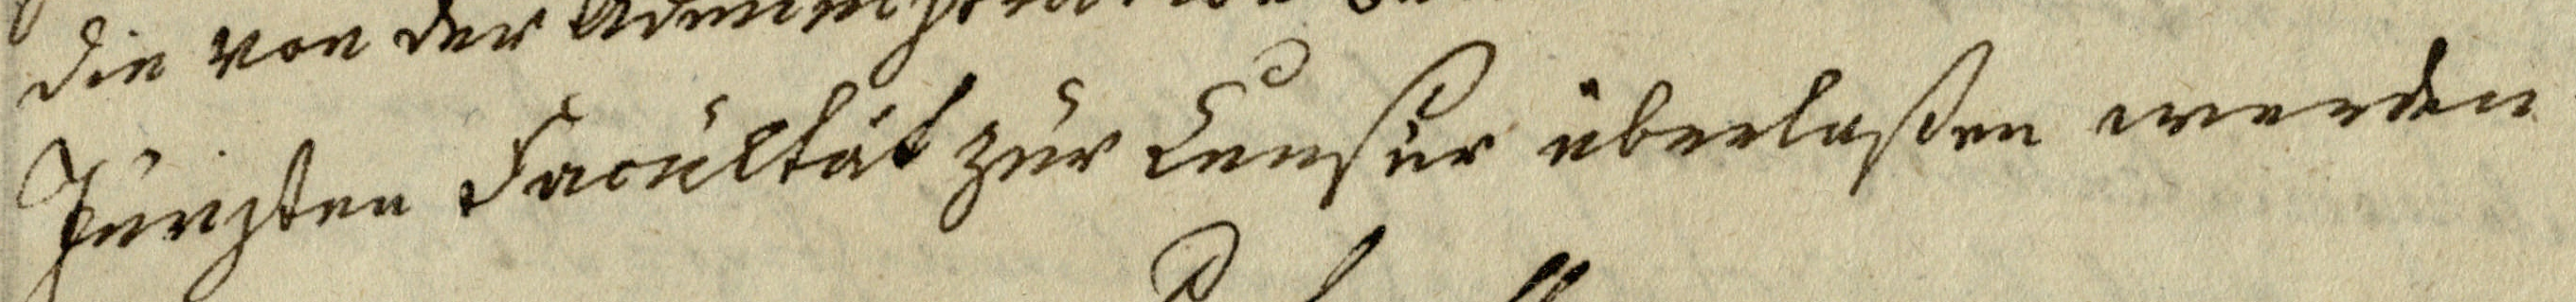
Juristen Facultät zur Censur überlassen werden.
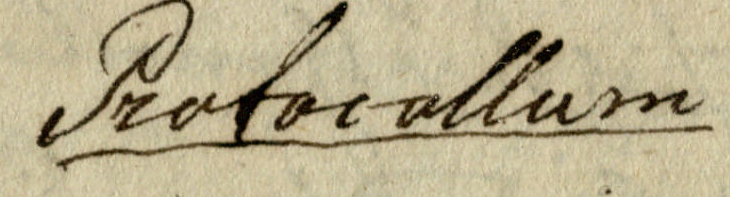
Protocollum
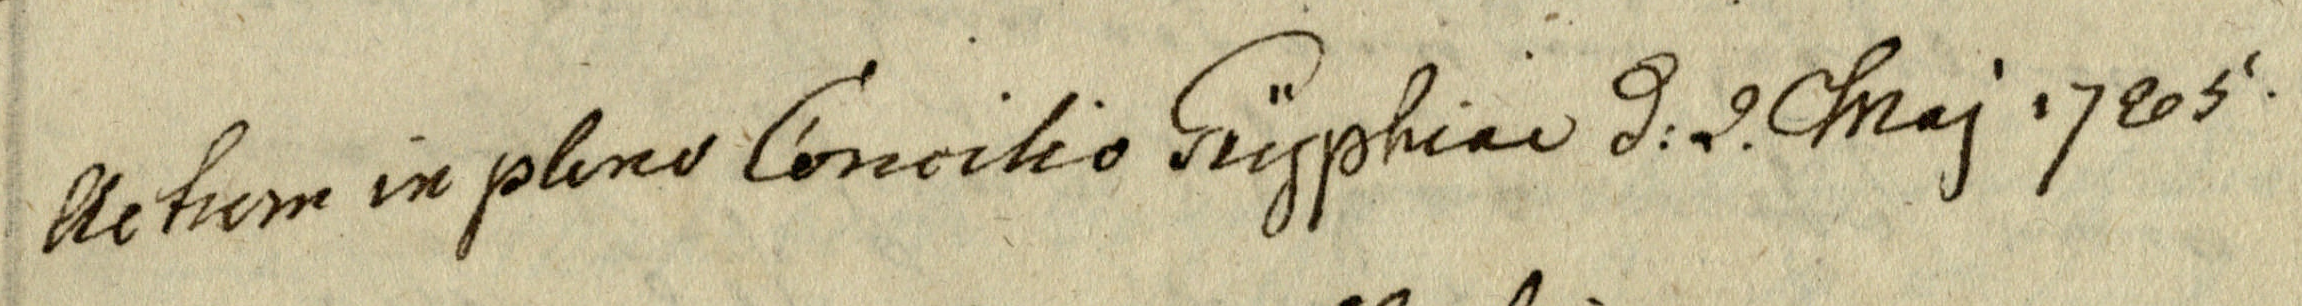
Actum in pleno Concilio Grÿphiae d. 2. Maj 1785.
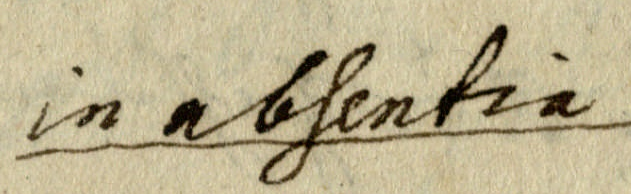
in absentia
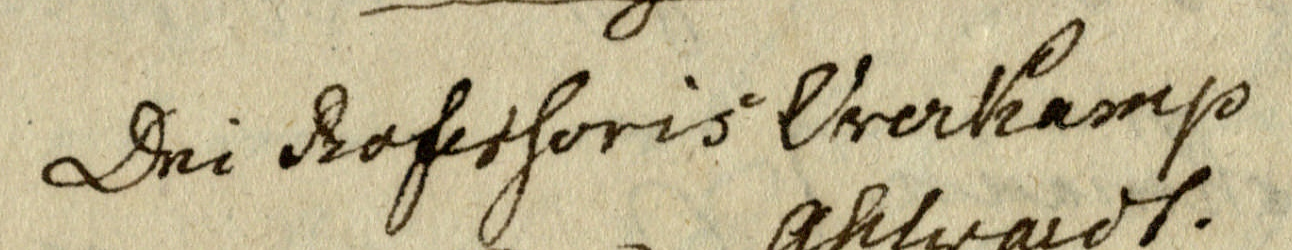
Dei Professoris Overkamp
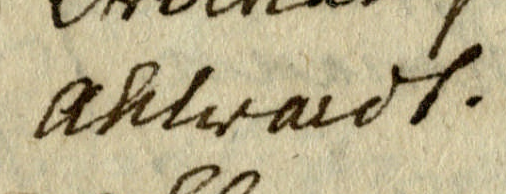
Ahlwardt.
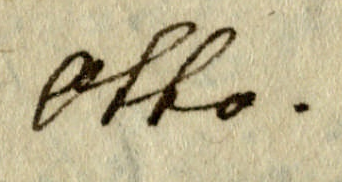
Otto.
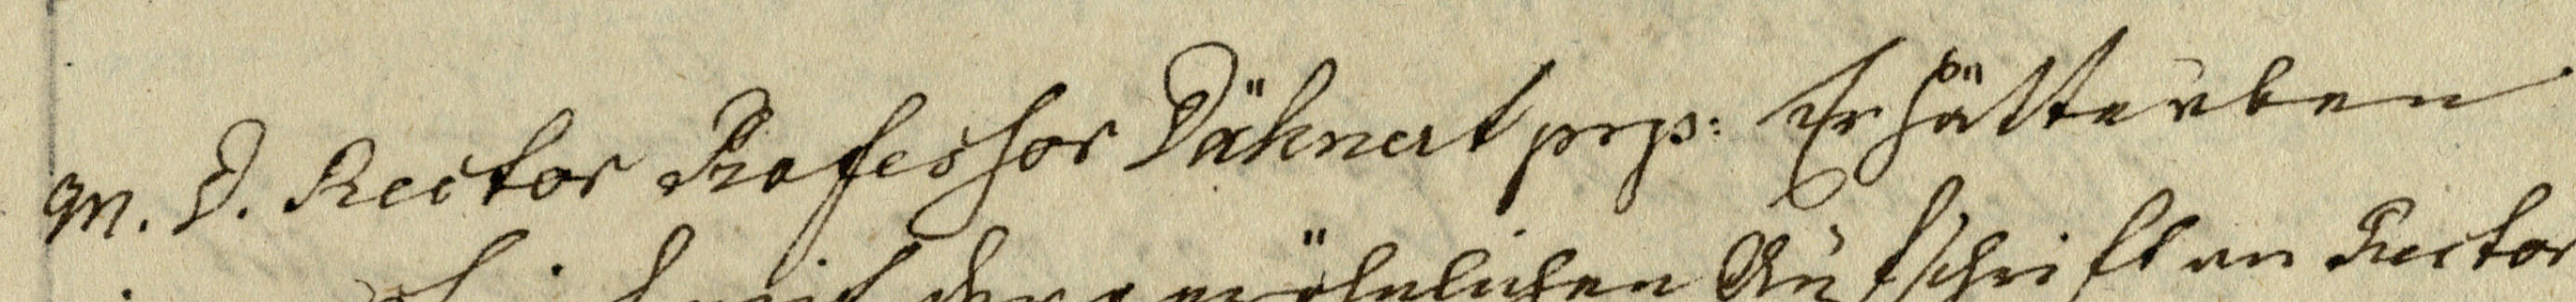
M. D. Rector Professor Dähnert prp. Er hätte eben
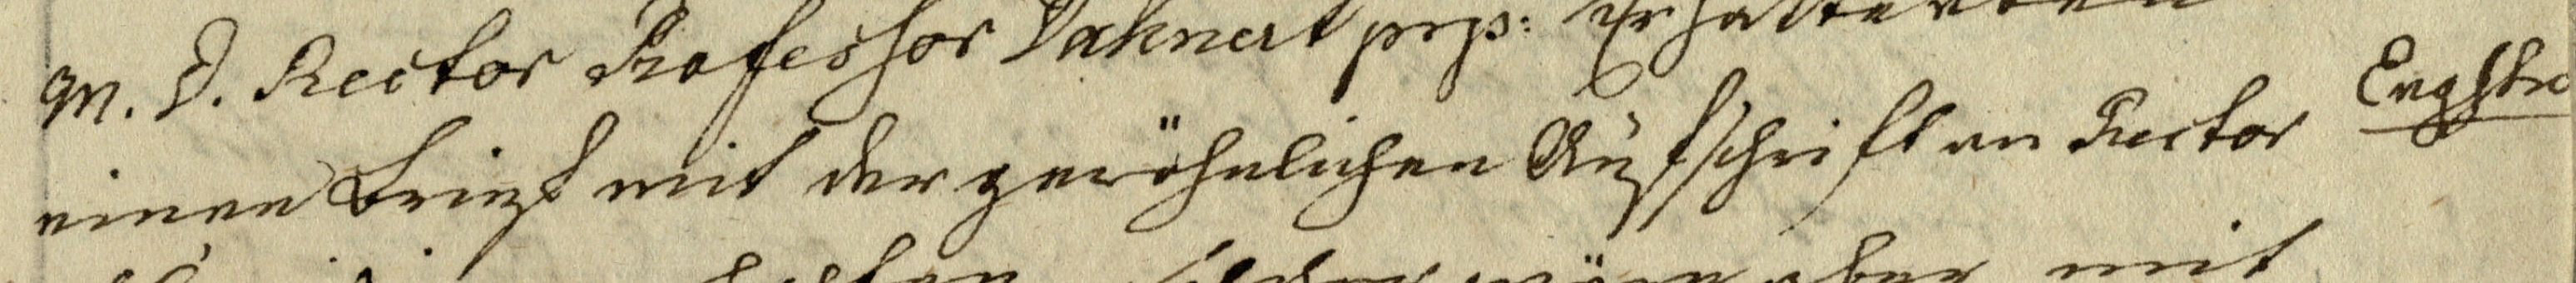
einen Brief mit der gewöhnlichen Aufschrift an Rector
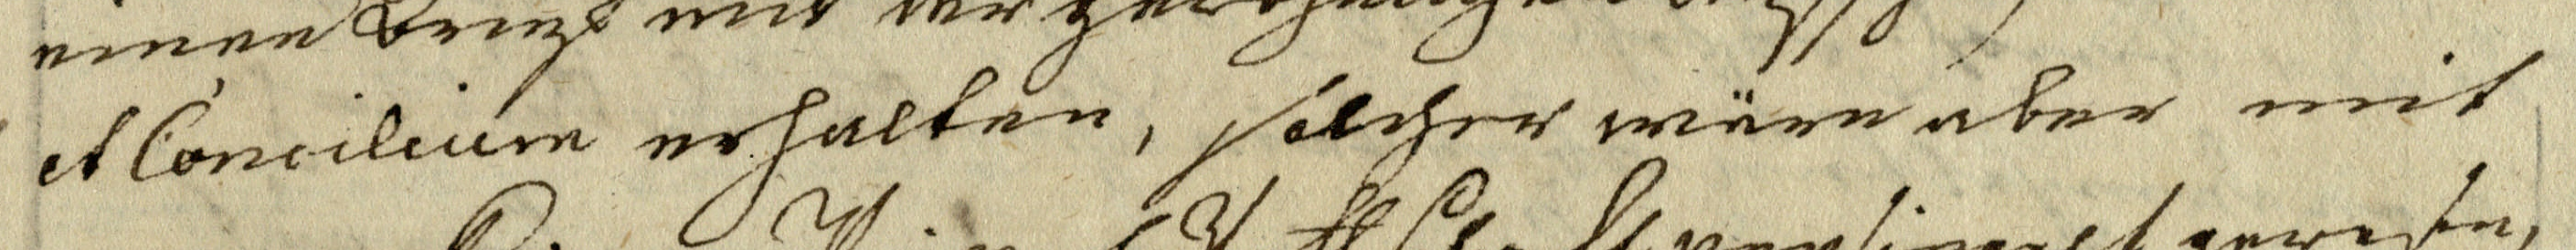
et Concilium erhalten, solcher wäre aber mit
